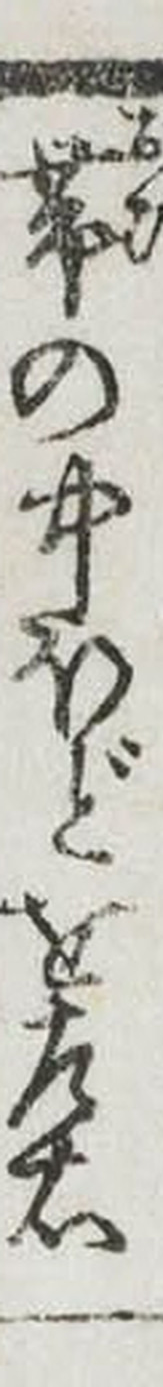帯の中ほどを左右
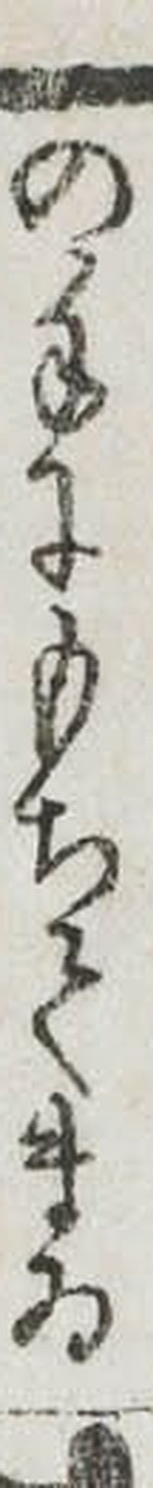の手にもちてまゐ
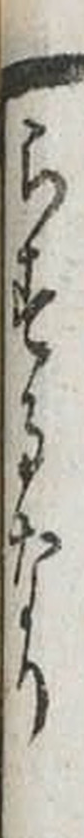らするなり
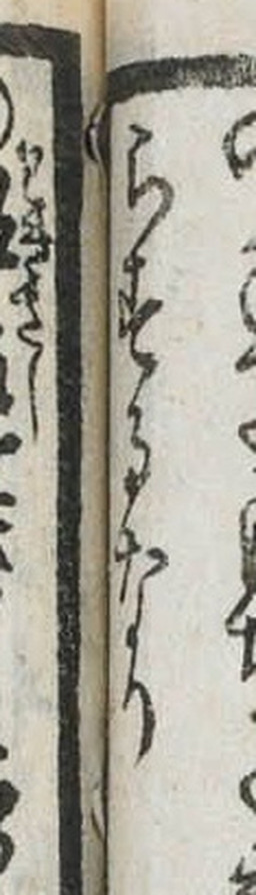らするなり
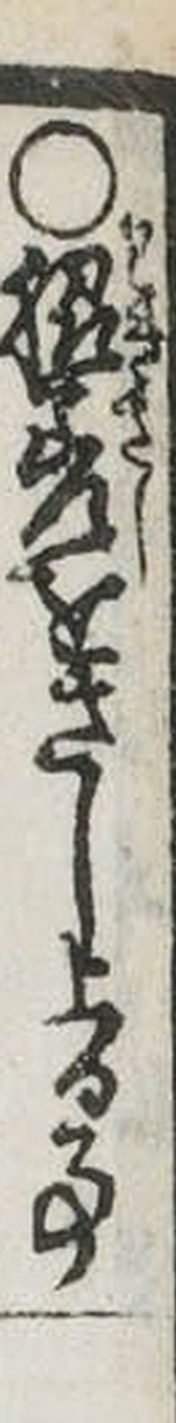○脇差をさし上る事
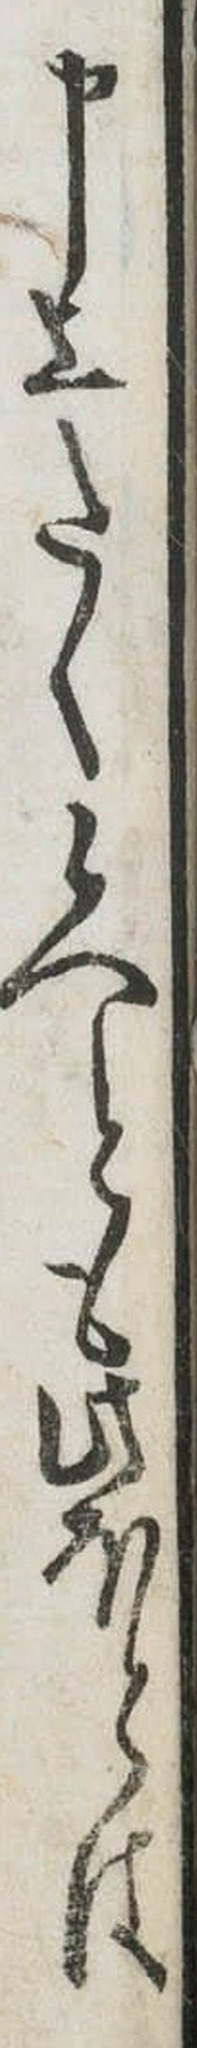申上たく候へとも此ほとは
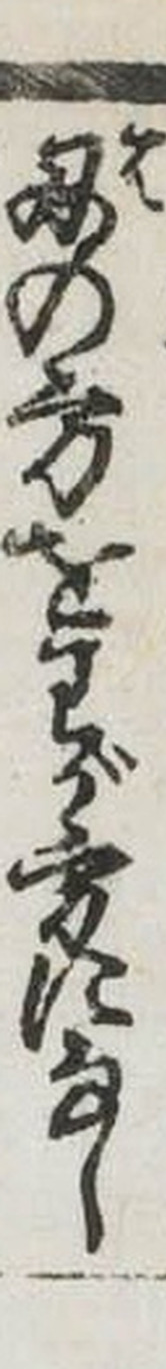刃の方をわが方になし
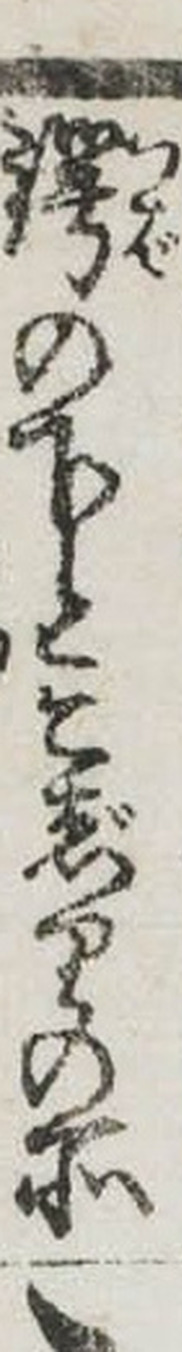鍔の下とこじりの所
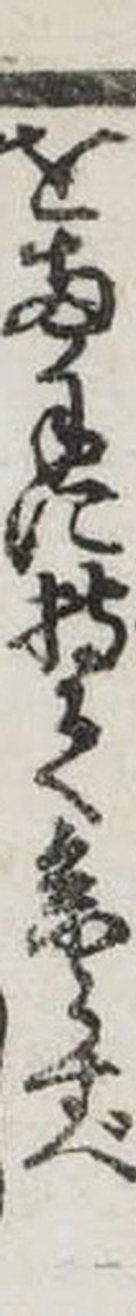を両手に持て参らすべし
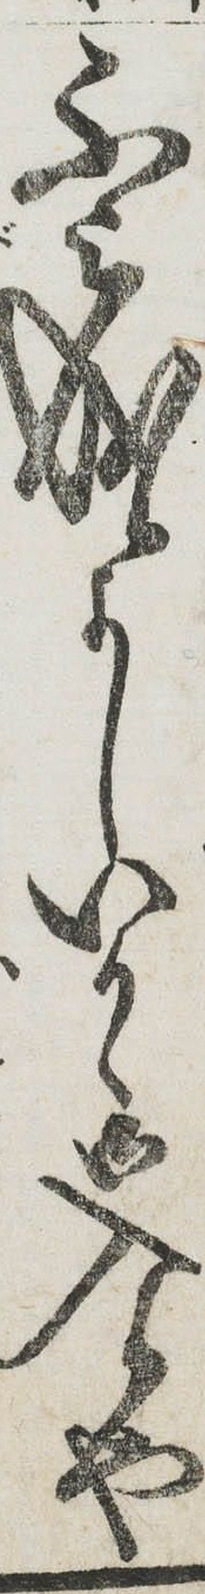不被成候よしいかゝ御入候や
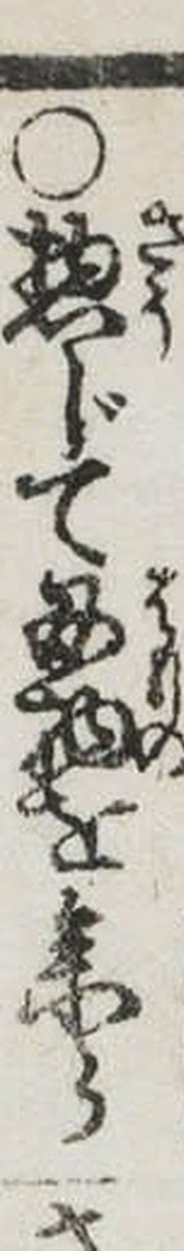○惣じて刃物を参ら
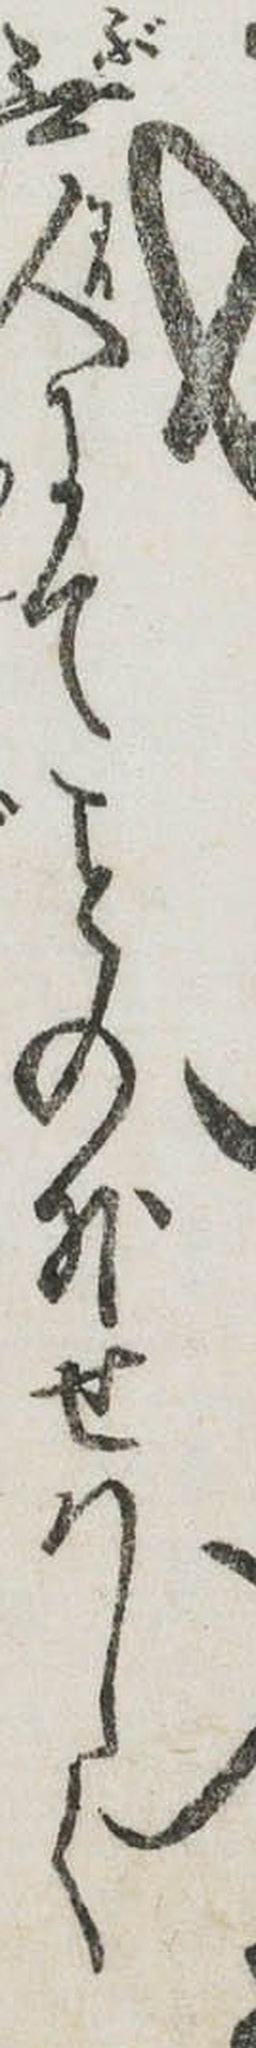無人にてことの外せはしく
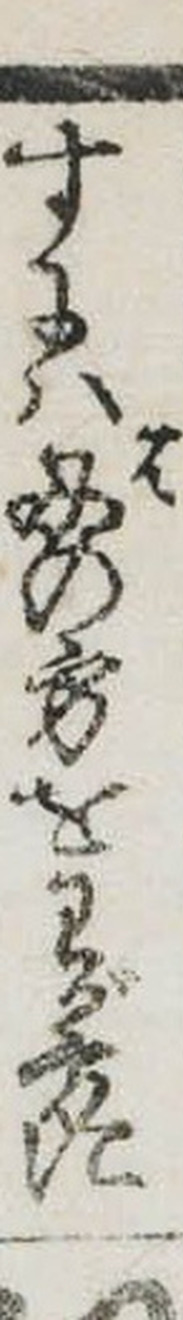すには刃の方をわが方に
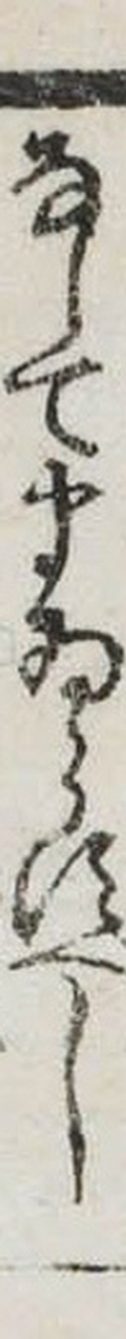なしてまゐらすべし
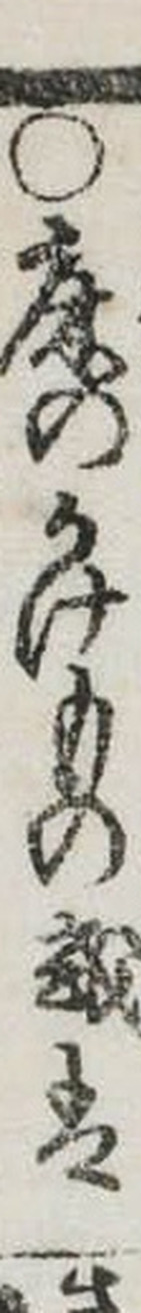○床のかけもの或は
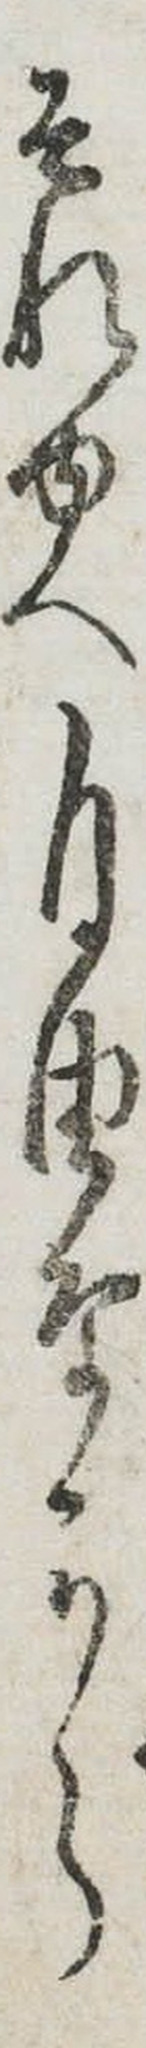それゆへ自由なから
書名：頭書萬用婦人手紙之文言
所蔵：東京学芸大学教育コンテンツアーカイブ
